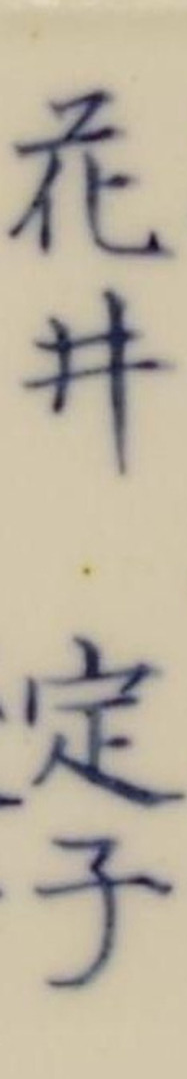花井定子
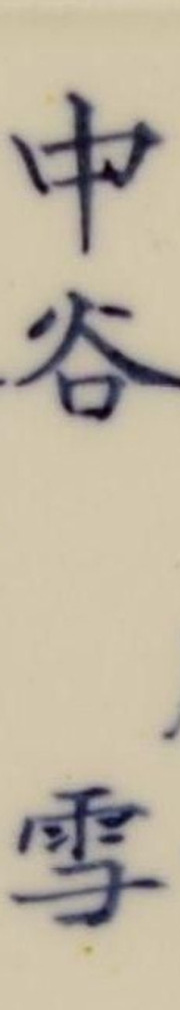中谷雪
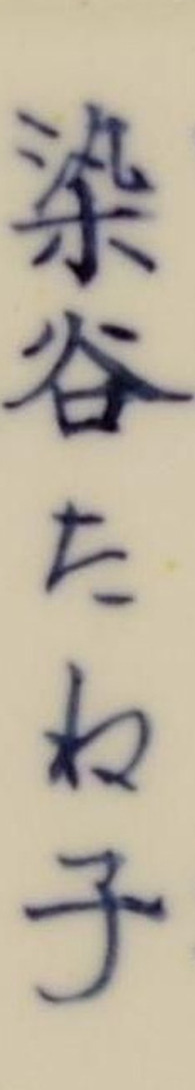染谷たね子
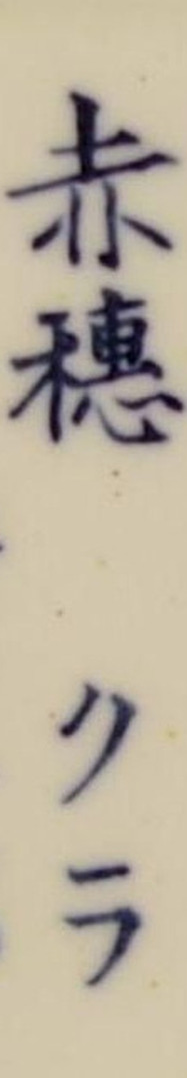赤穂クラ
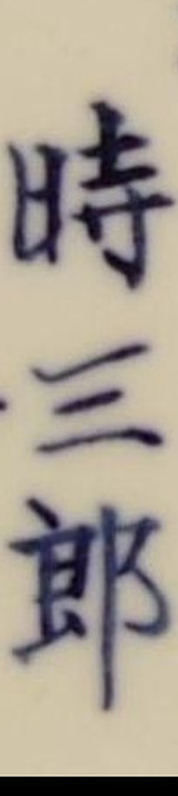時三郎
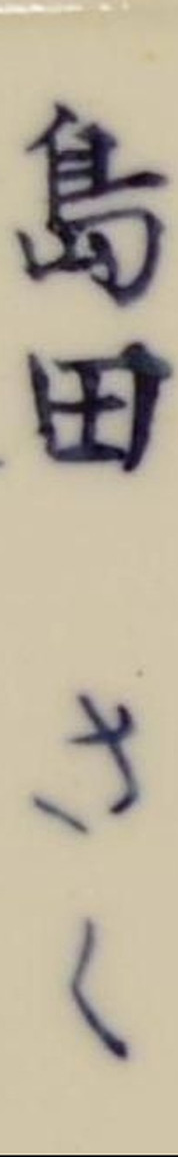島田さく
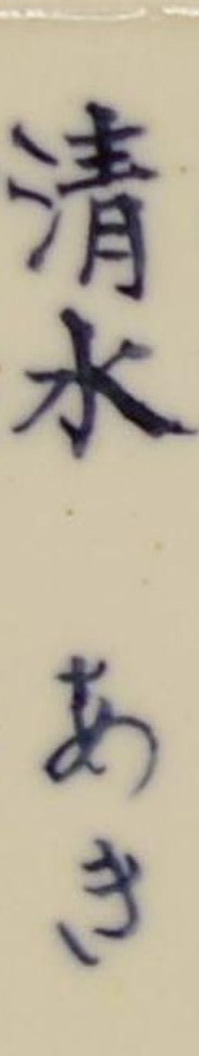清水あき
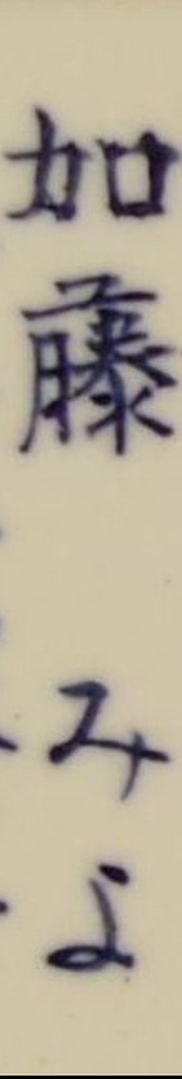加藤みよ
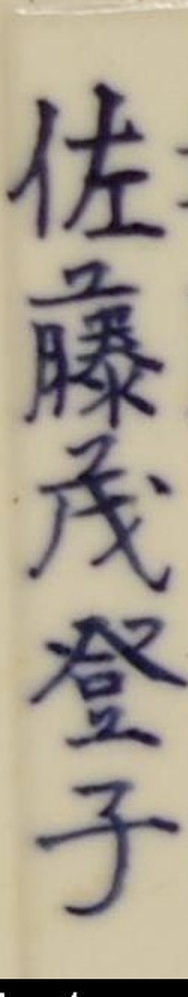佐藤茂登子

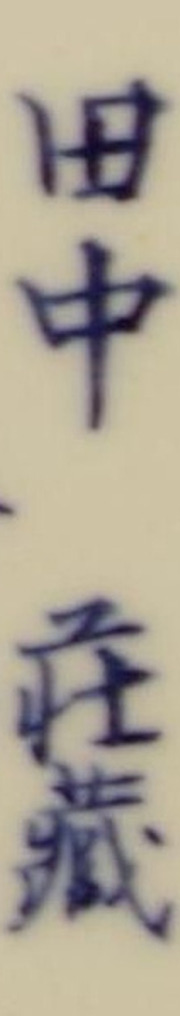田中荘藏
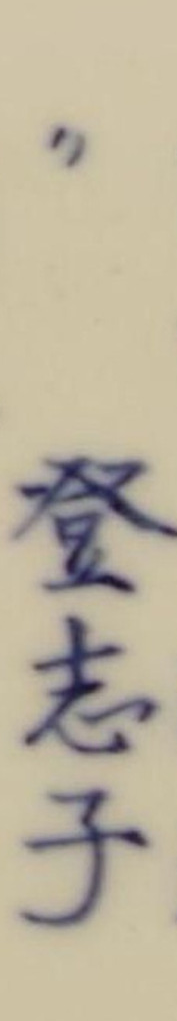登志子
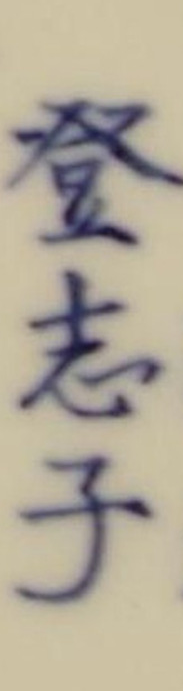登志子
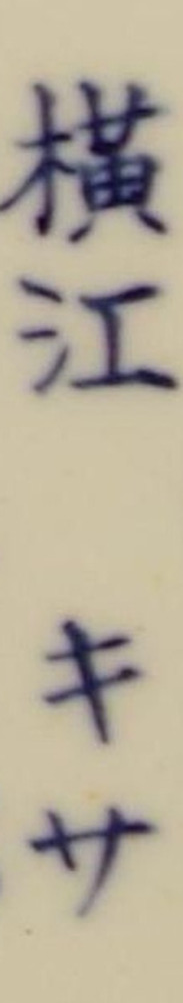横江キサ
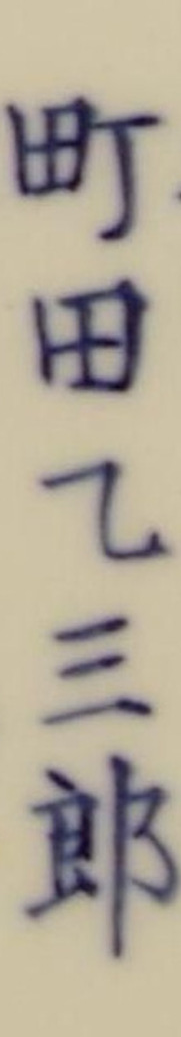町田乙三郎
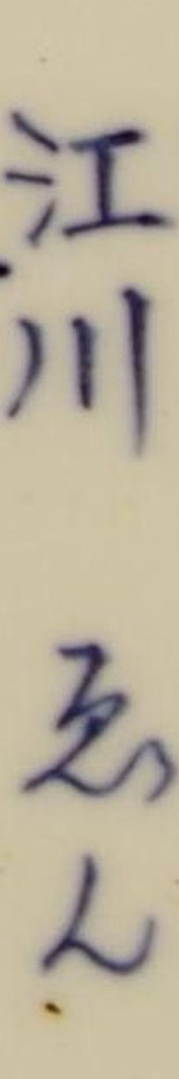江川えん
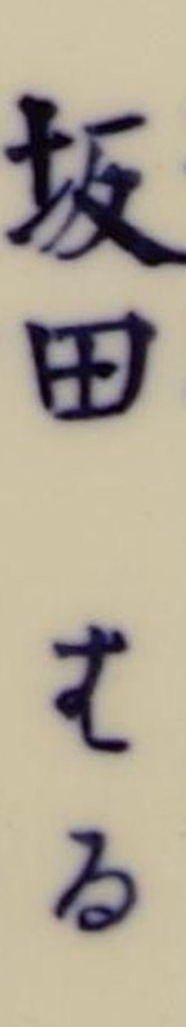坂田はる
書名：E~L
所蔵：高野山金剛峯寺
